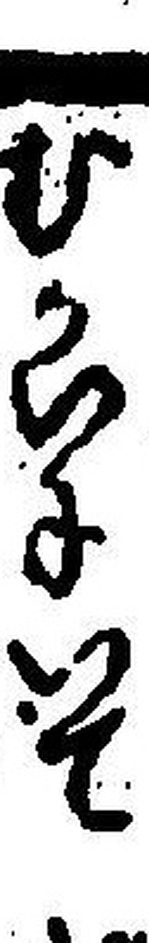むかいにいで
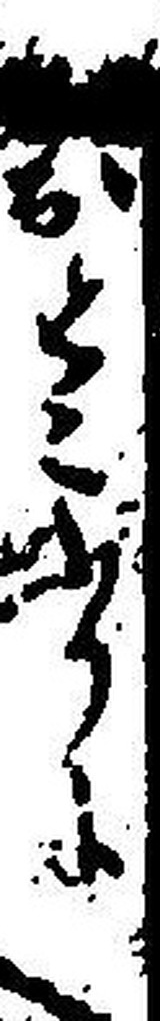おとこぶりに
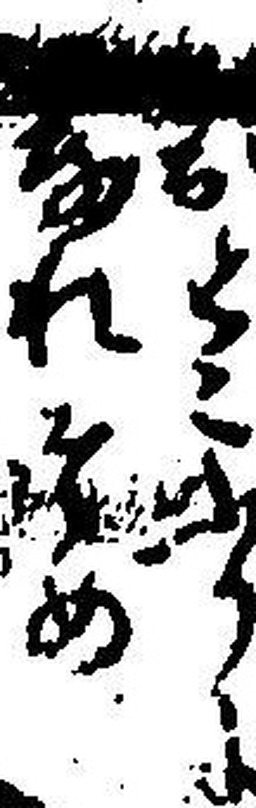なれそめ
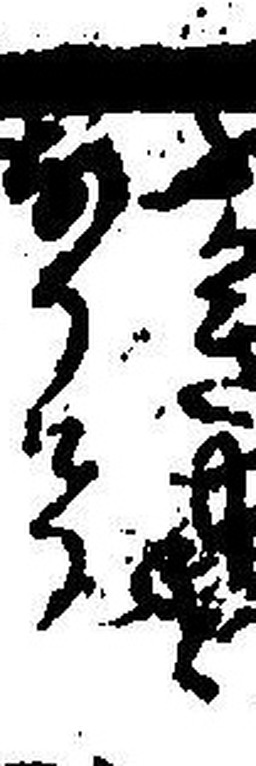なりけり
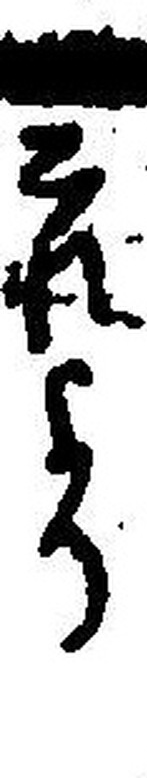これより
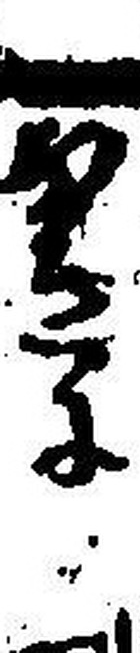おきに
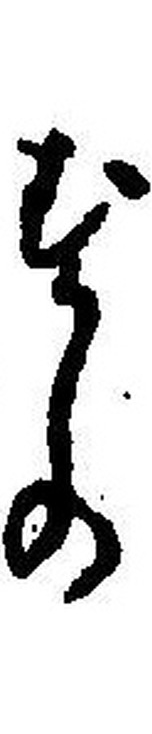むかしの
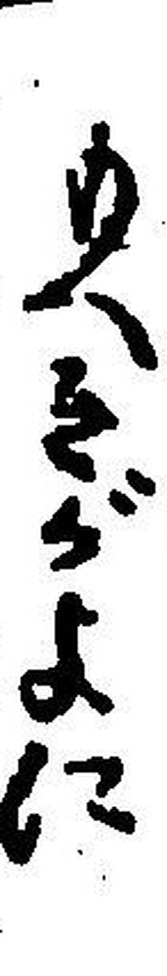もへきがよに
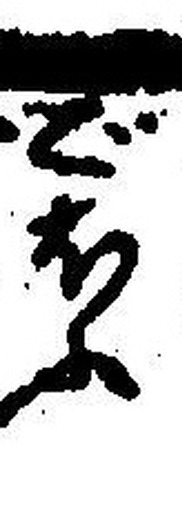ごほふ
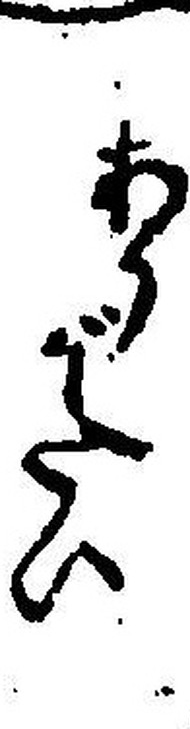ありがたい
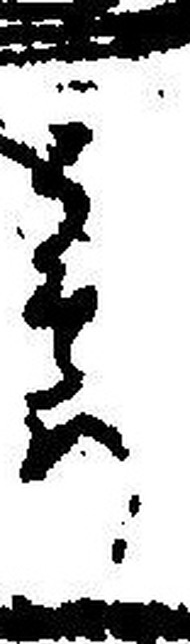うそは
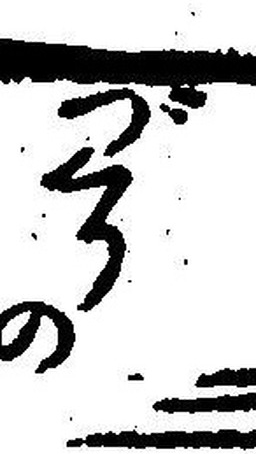づくりの
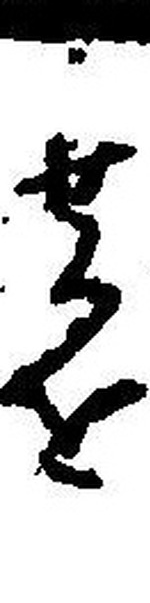せるを
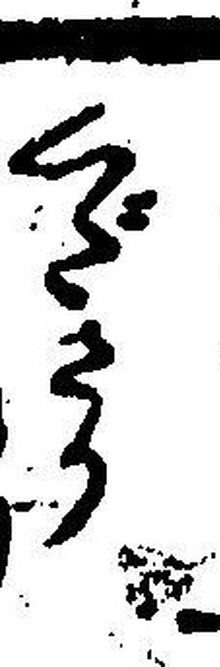くださり
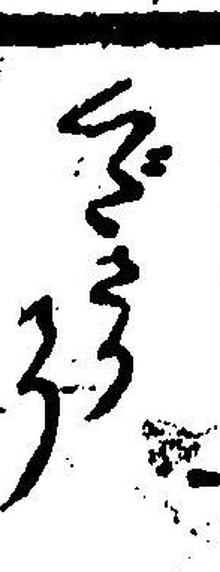くださり

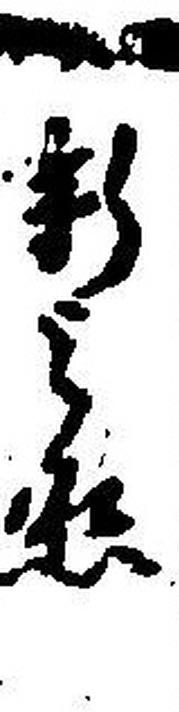新之丞
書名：御代参牛時詣 / 市場通笑作
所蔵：東京大学総合図書館 General Library in the University of Tokyo, JAPAN
